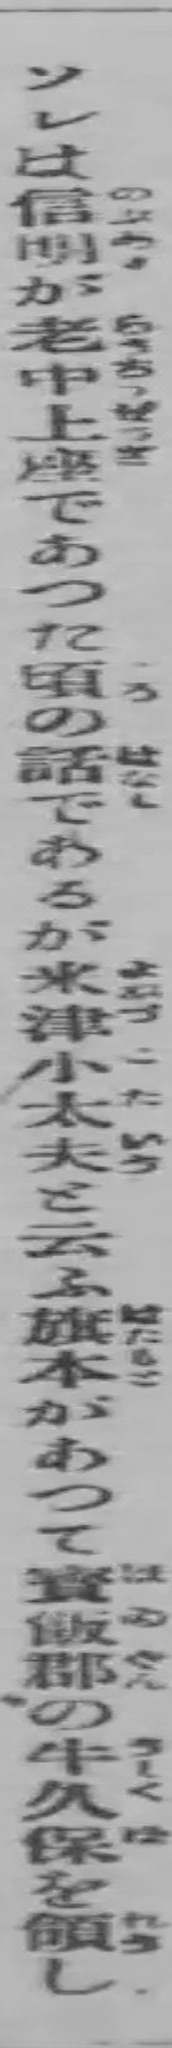信明の廉潔ソレは信明が老中上座であつた頃の話であるが米津小太夫と云ふ旗本があつて宝飯郡の牛久保を領し
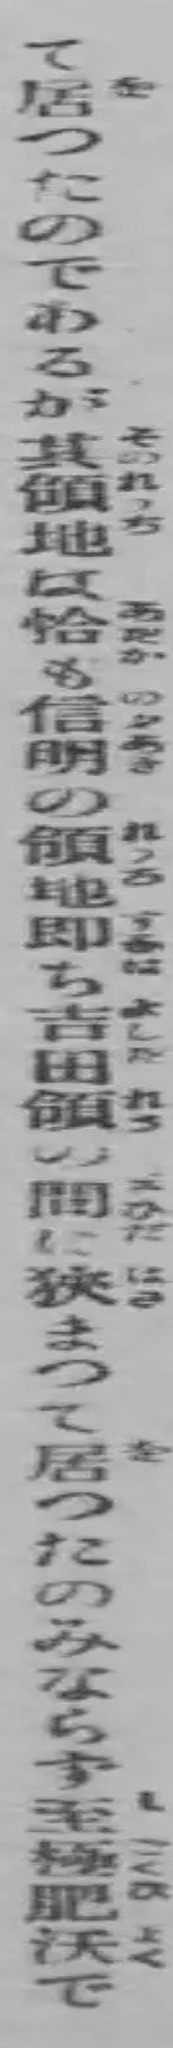て居つたのであるが其領地は恰も信明の領地即ち吉田領の間に狭まつて居つたのみならず至極肥沃で
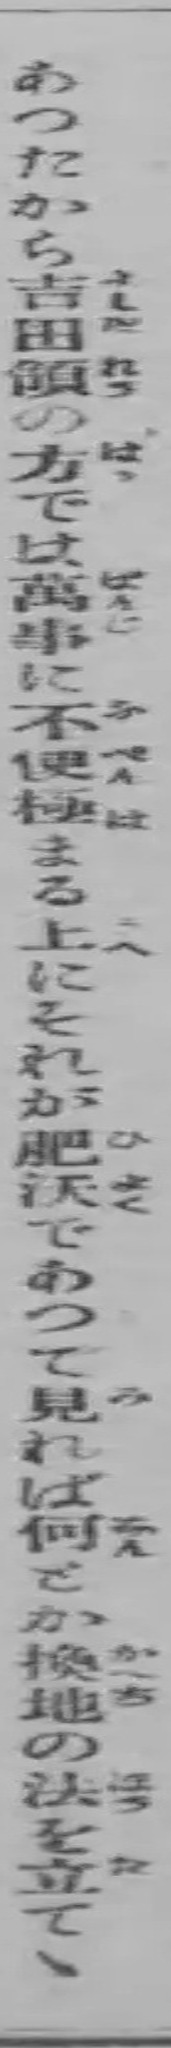あつたから吉田領の方では万事に不便極まる上にそれが肥沃であつて見れば何とか換地の法を立てゝ
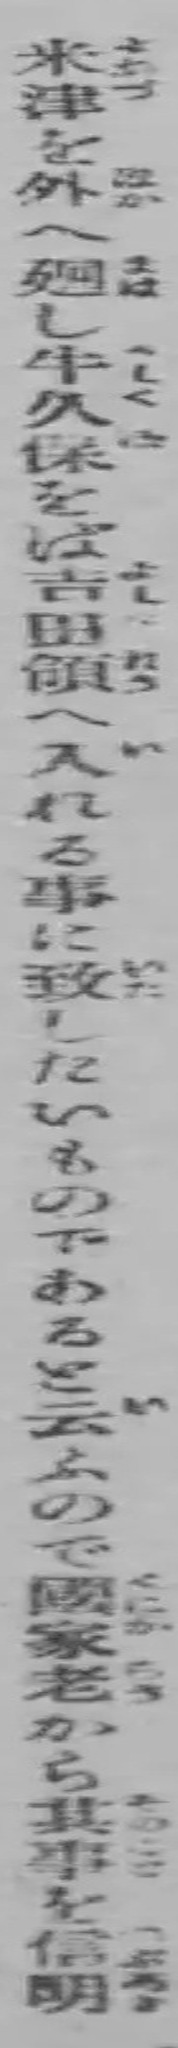米津を外へ廻し牛久保をば吉田領へ入れる事に致したいものであると云ふので国家老から其事を信明
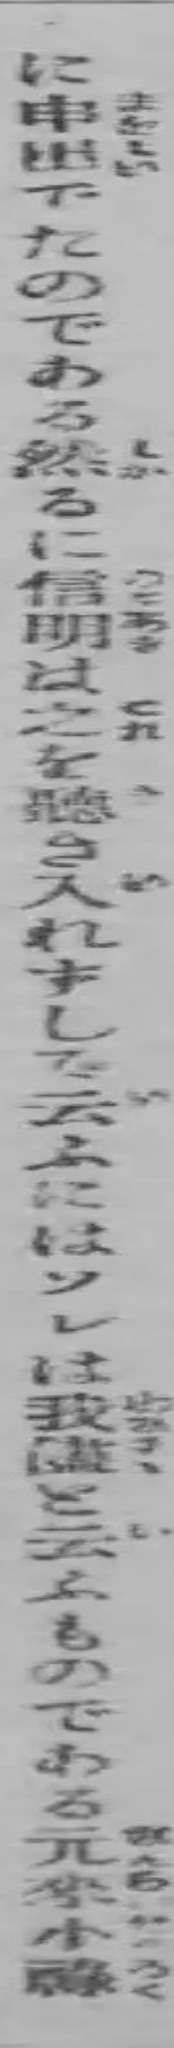に申出でたのである然るに信明は之を聴き入れずして云ふにはソレは我儘と云ふものである元来小禄
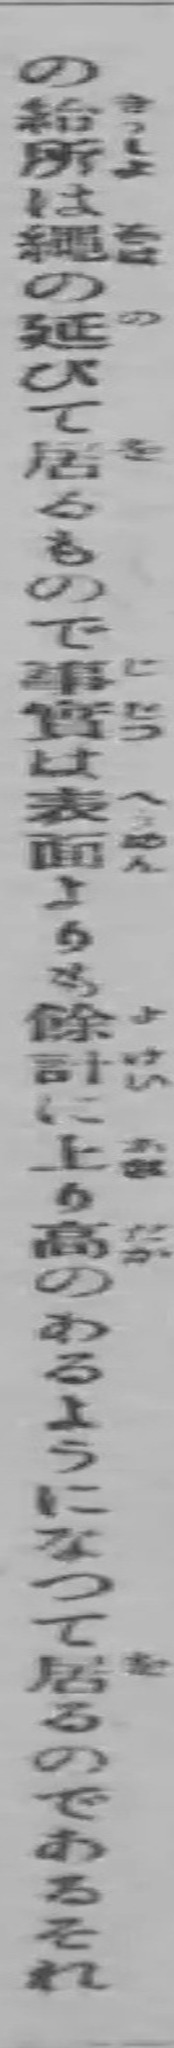の給所は縄の延びて居るもので事実は表面よりも余計に上り高のあるようになつて居るのであるそれ
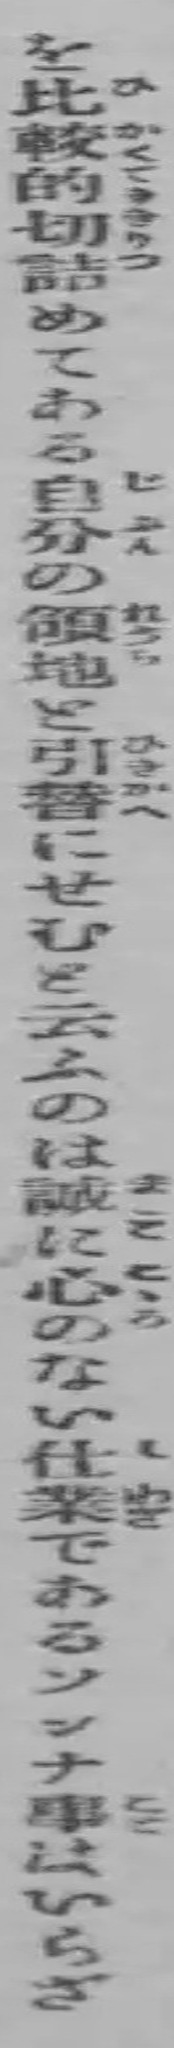を比較的切詰めて自分の領地と引替にせむと云ふのは誠に心のない仕業であるソンナ事はいらざ
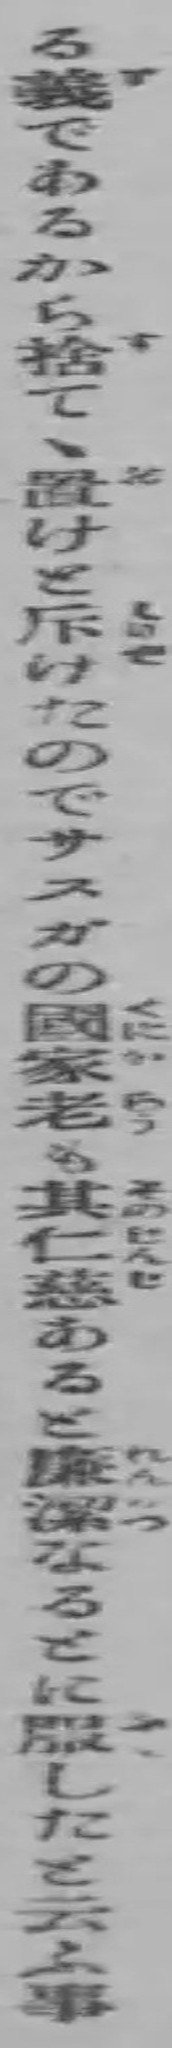る義であるから捨てゝ置けと斥けたのでサスガの国家老も其仁慈あると廉潔なるとに服したと云ふ事
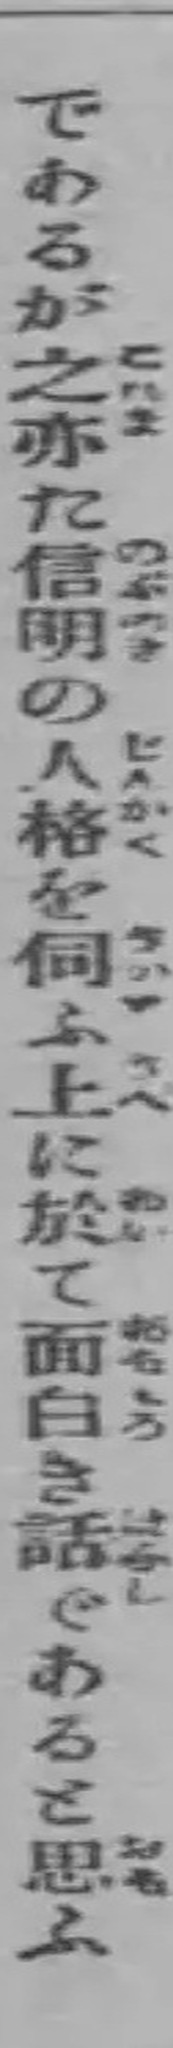であるが之亦た信明の人格を伺ふ上に於て面白き話であると思ふ

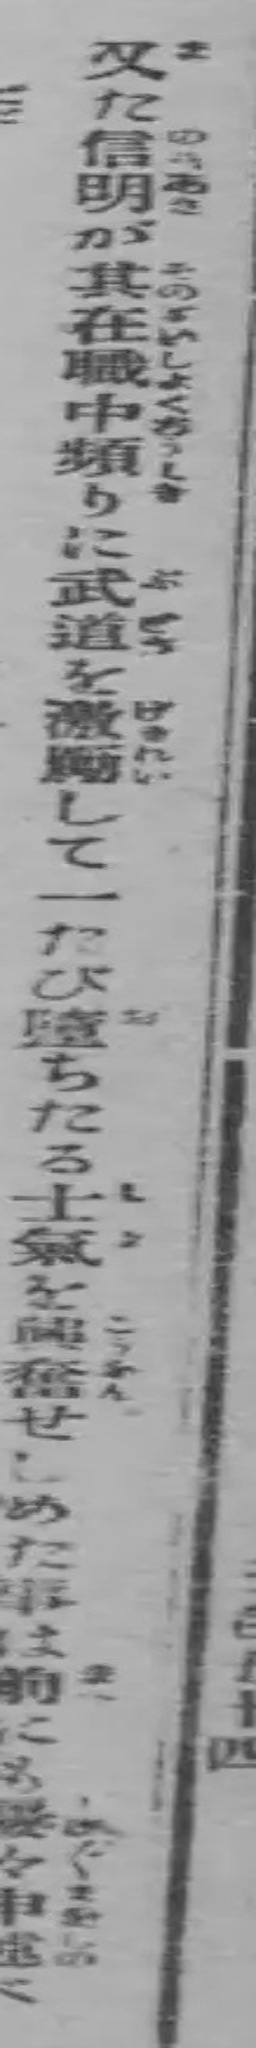文学の奨励又た信明が其在職中頻りに武道を激励して一たび堕ちたる士気を興奮せしめた事は前にも屡々申述べ
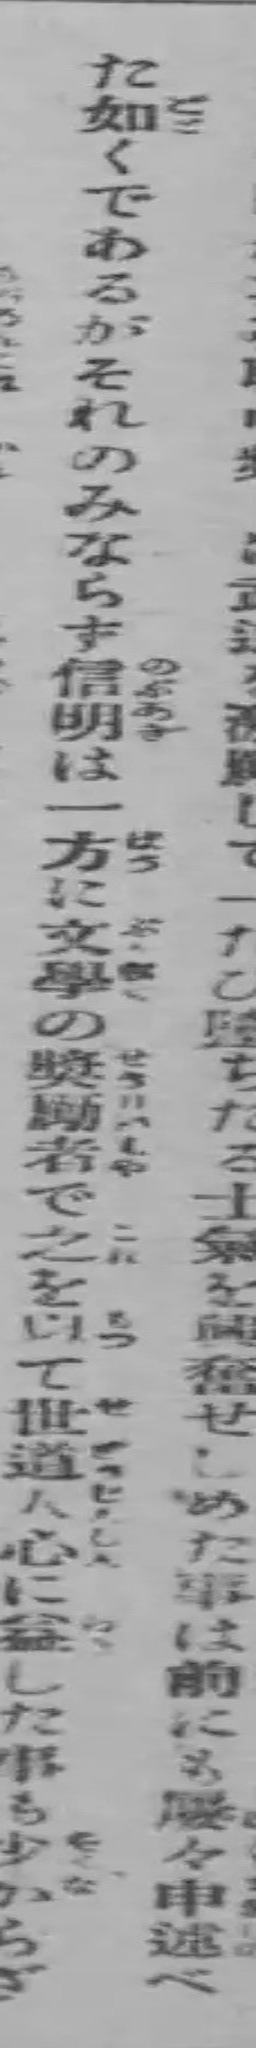た如くであるがそれのみならず信明は一方に文学の奨励者で之を以て世道人心に益した事も少からざ
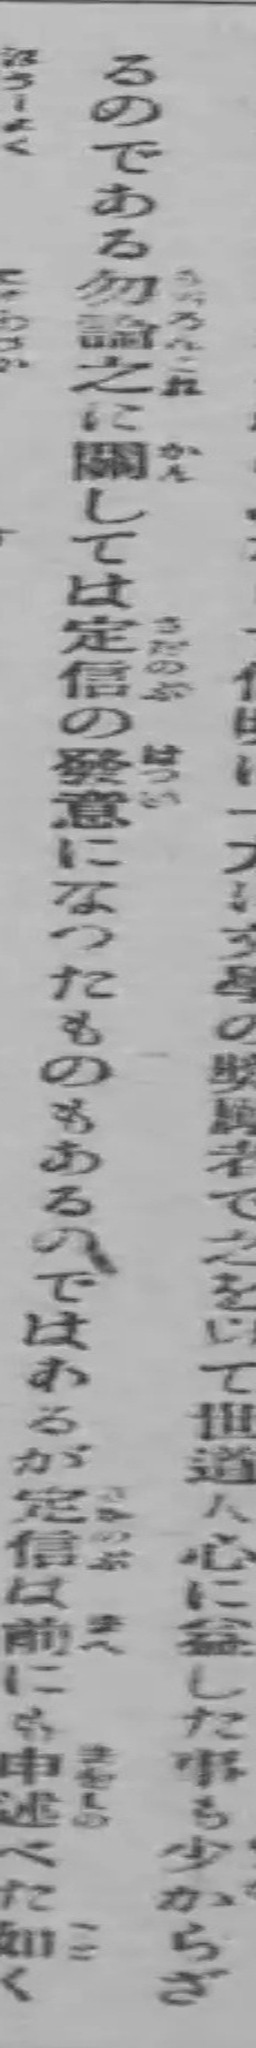るのである勿論之に関しては定信の発意になつたものもあるのではあるが定信は前にも申述べた如く
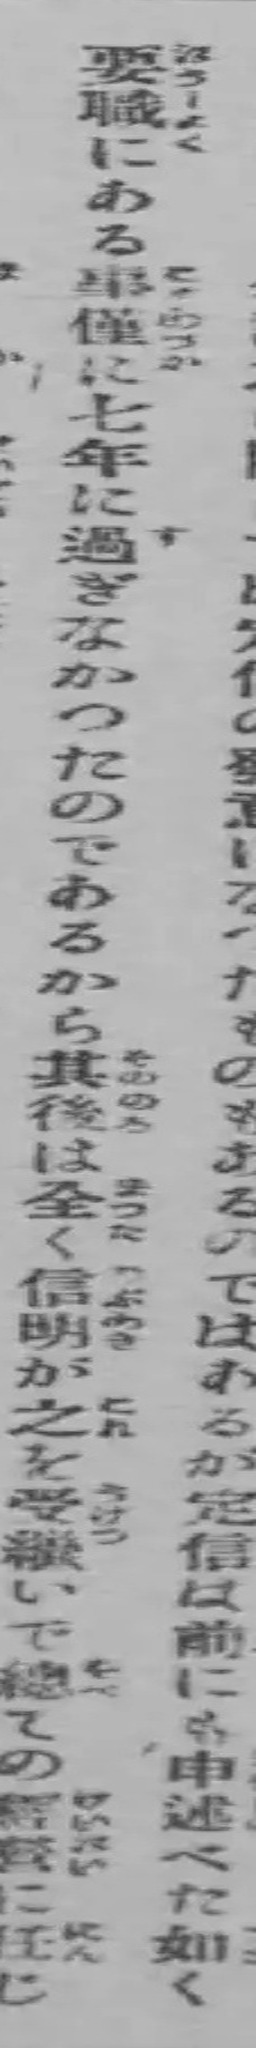要職にある事僅に七年に過ぎなかつたのであるから其後は全く信明が之を受継いで総ての経営に任じ
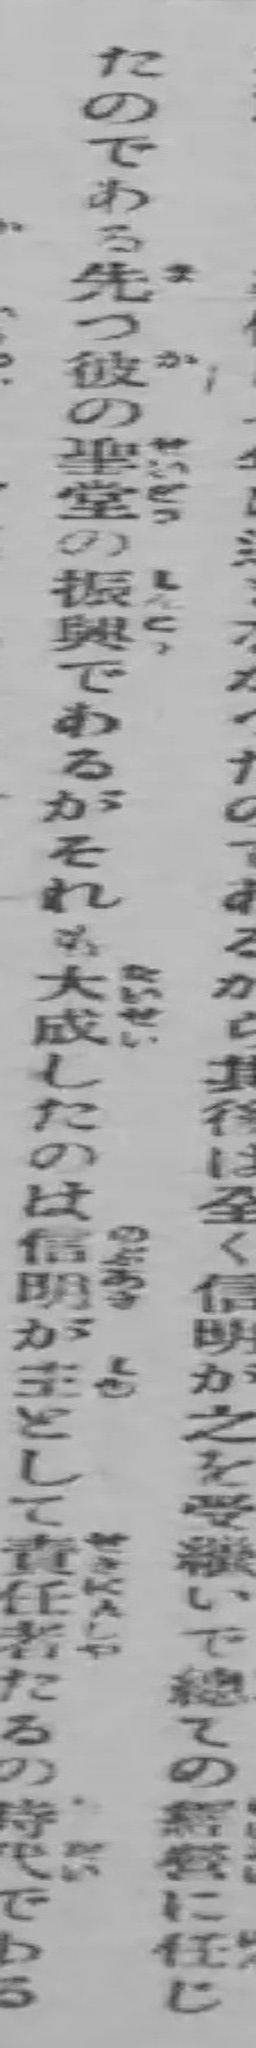たのである先づ彼の聖堂の振興であるがそれも大成したのは信明が主として責任者たるの時代である
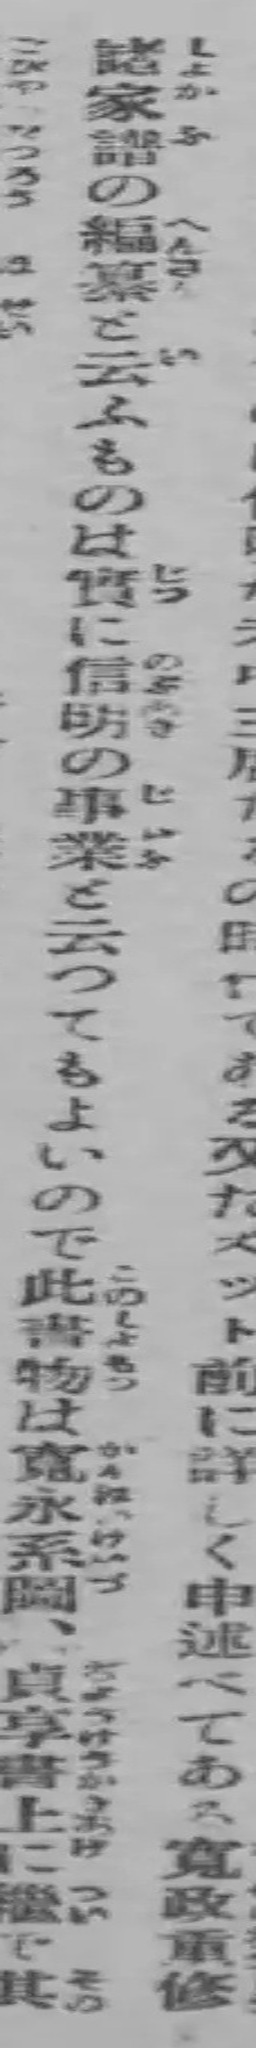諸家譜の編纂と云ふものは実に信明の事業と云つてもよいので此書物は寛永系図、貞享書上に継で其
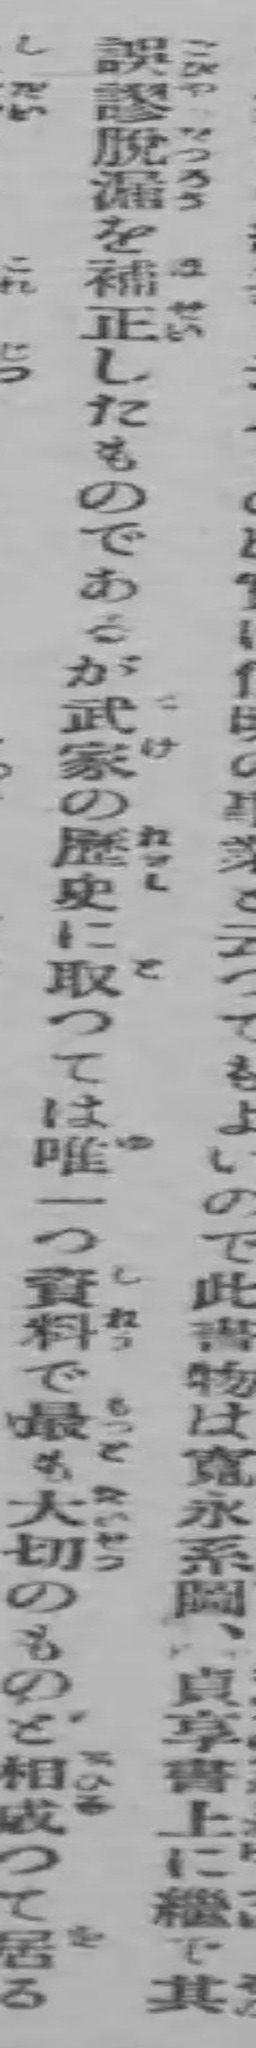誤謬脱漏を補正したものであるが武家の歴史に取つては唯一つ資料で最も大切のものと相成つて居る
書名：豊橋市史談
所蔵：国立国会図書館 National Diet Library, JAPAN
